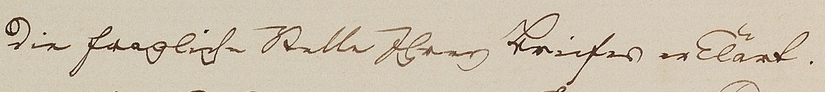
die fragliche Stelle Ihres Briefes erklärt.
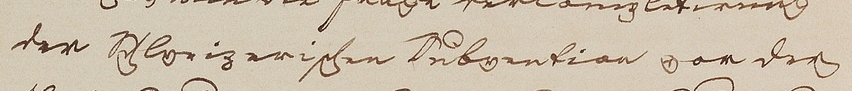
der Schweizerischen Subvention vor der
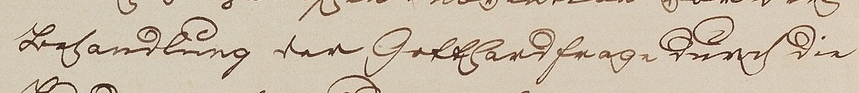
Behandlung der Gotthardfrage durch die
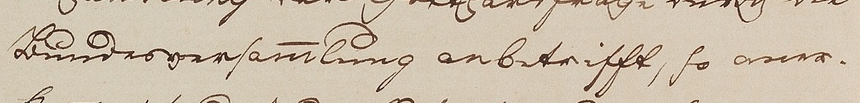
Bundesversammlung anbetrifft, so aner-
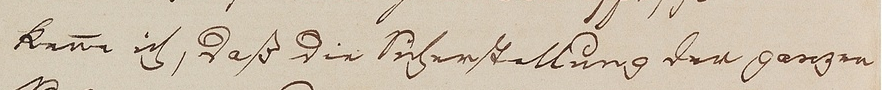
kenne ich, daß die Sicherstellung der ganzen
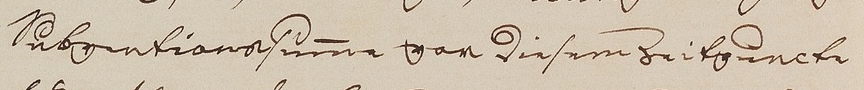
Subventionssumme vor diesem Zeitpuncte
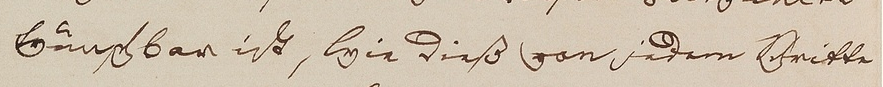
wünschbar ist, wie dieß von jedem Schritte
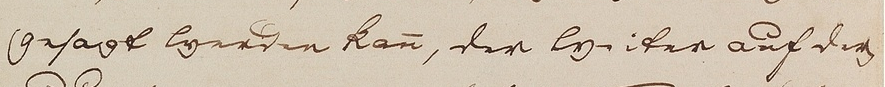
gesagt werden kann, der weiter auf der
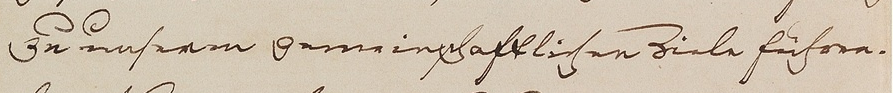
zu unserm gemeinschaftlichen Ziele führen-
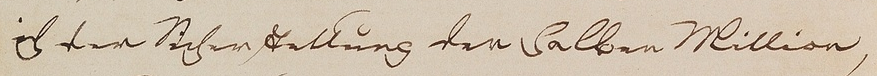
ich der Sicherstellung der halben Million,
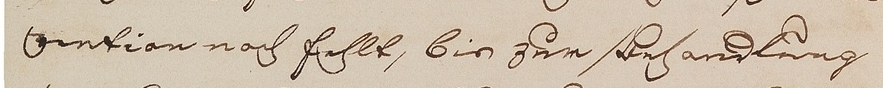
vention noch fehlt, bis zur Behandlung
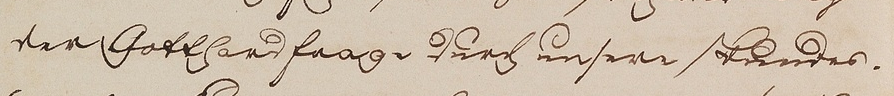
der Gotthardfrage durch unsere Bundes-
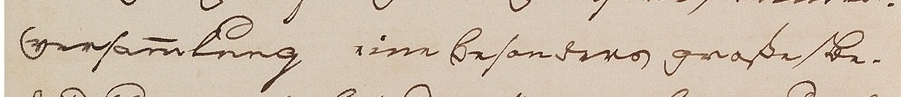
versammlung eine besonders große Be-
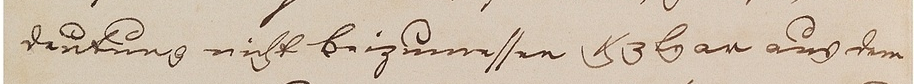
deutung nicht beizumessen & zwar aus dem
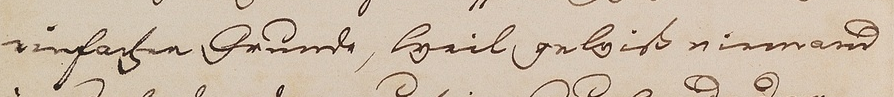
einfachen Grunde, weil gewiß niemand
